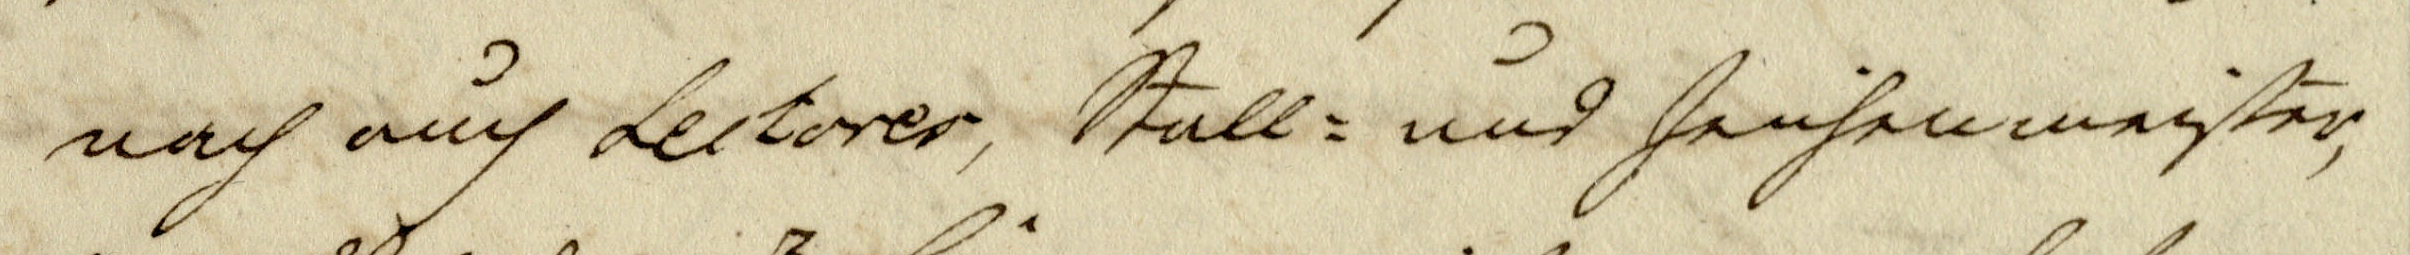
nach auch Lectores, Stall- und Zeichenmeister,
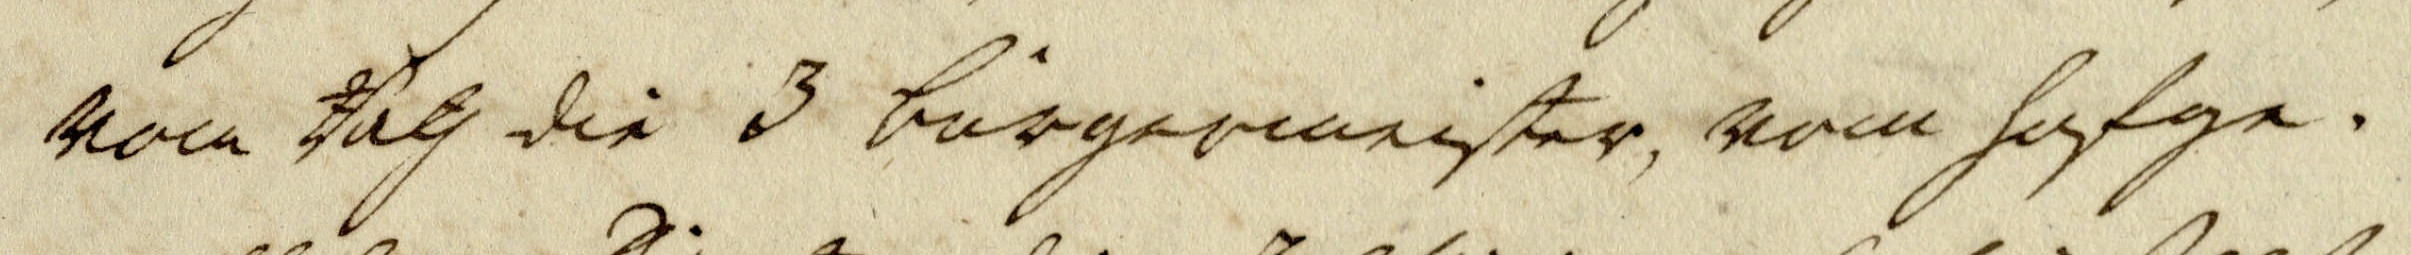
vom Rath die 3 Bürgermeister, vom Hofge¬
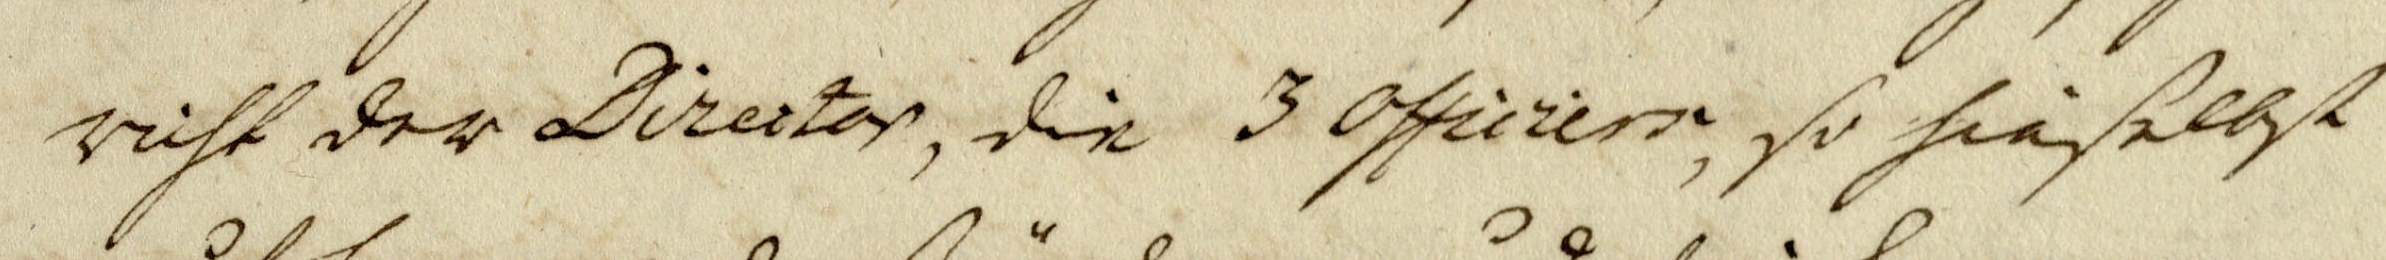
richt der Director, die 3 Officiers, so hieselbst
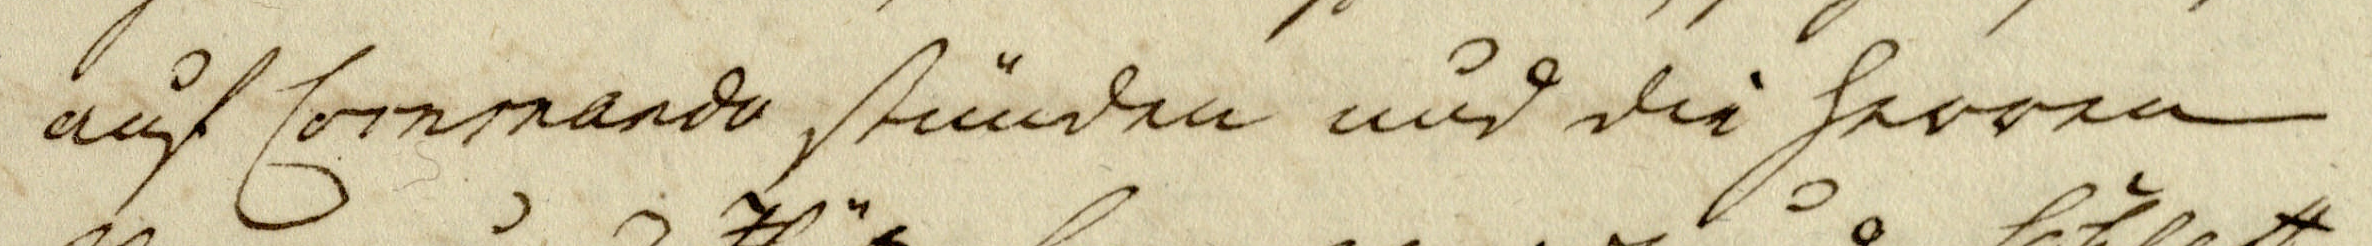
auf Commando stünden und die Herren
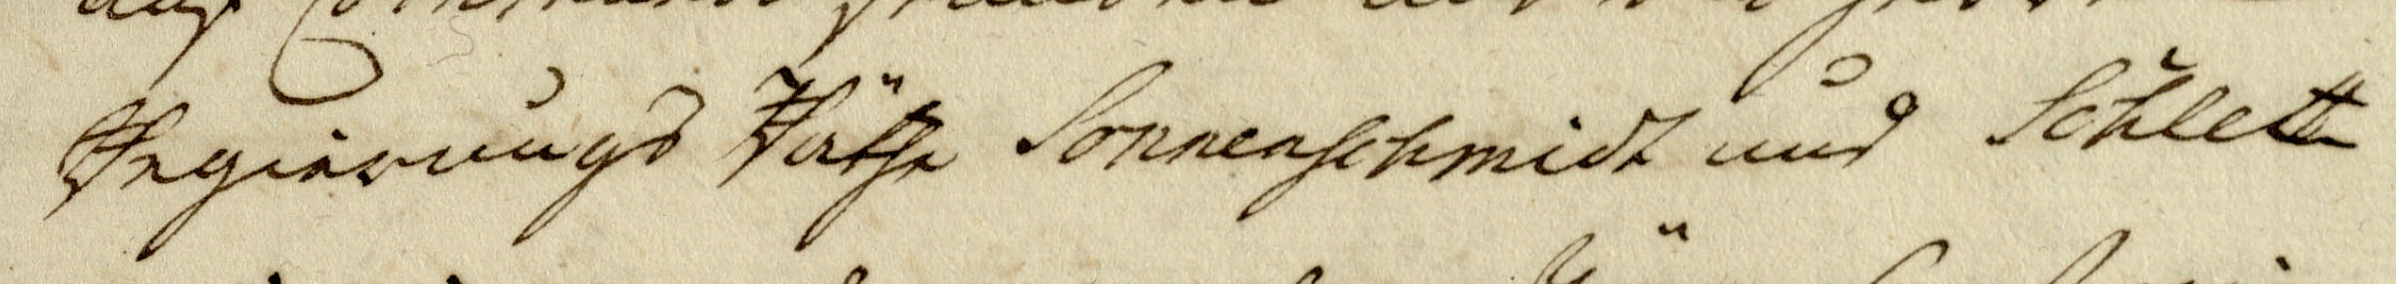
Regierungs Räthe Sonnenschmidt und Schlett¬
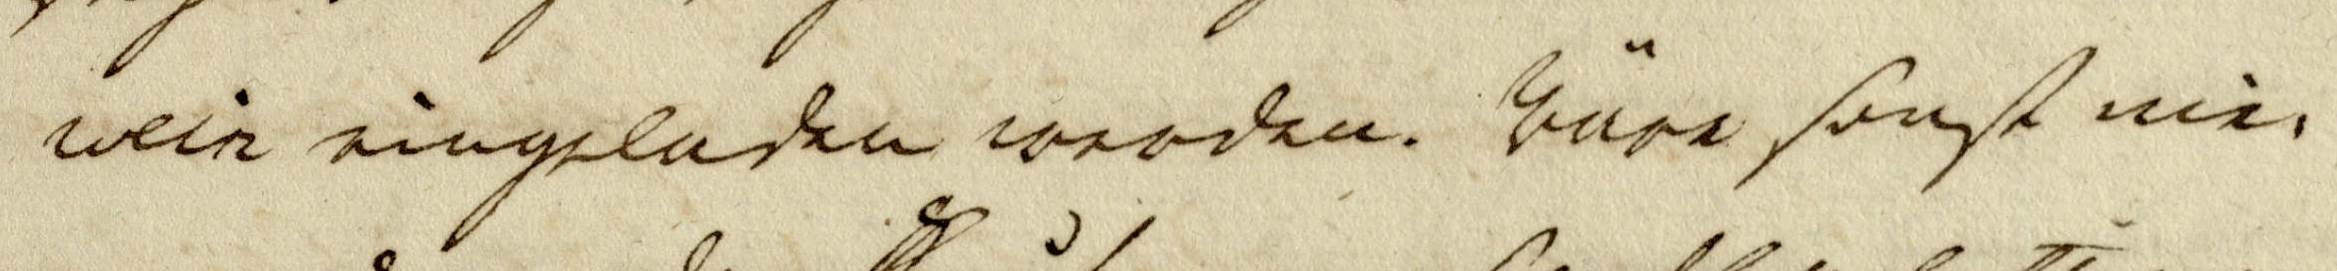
wein eingeladen werden. Wäre sonst nie¬
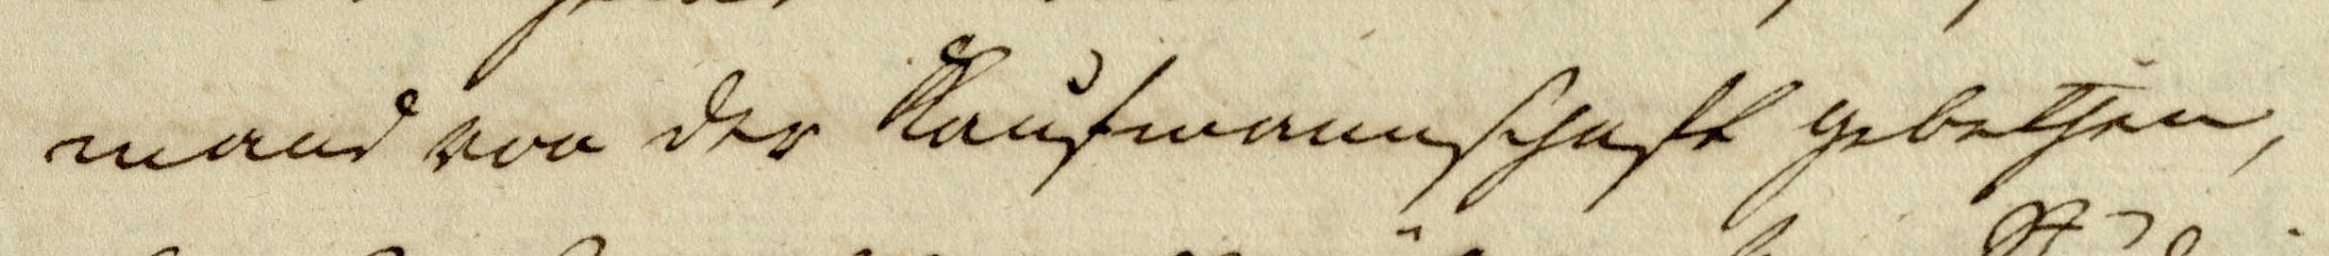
mand von der Kaufmannschaft gebethen,
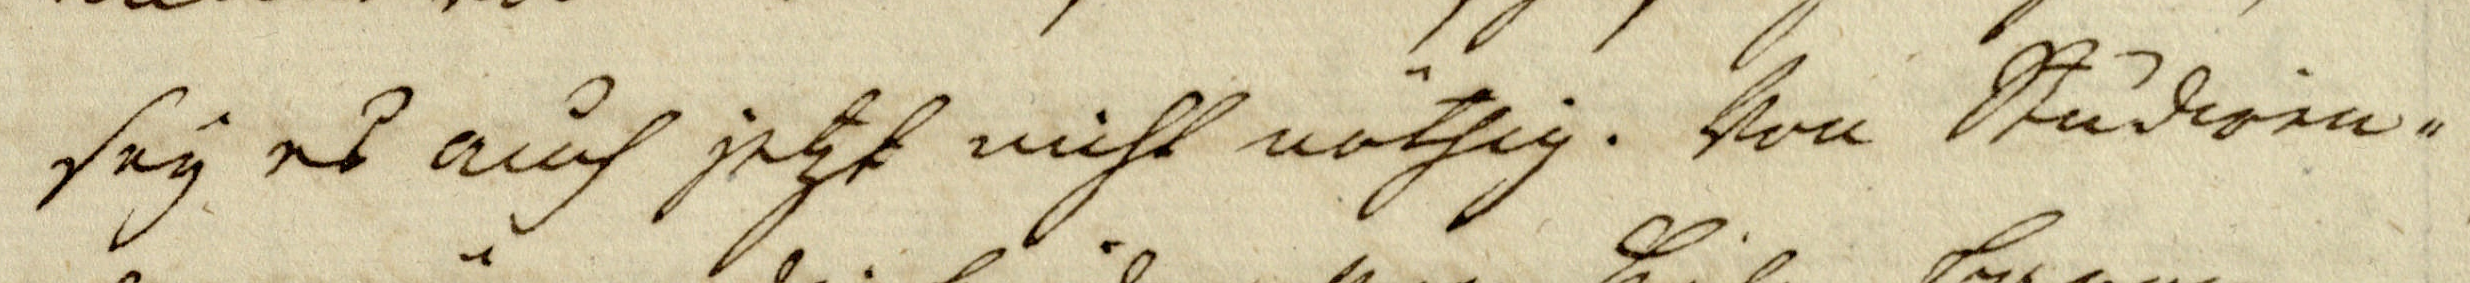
seÿ es auch jetzt nicht nöthig. Von Studiren¬
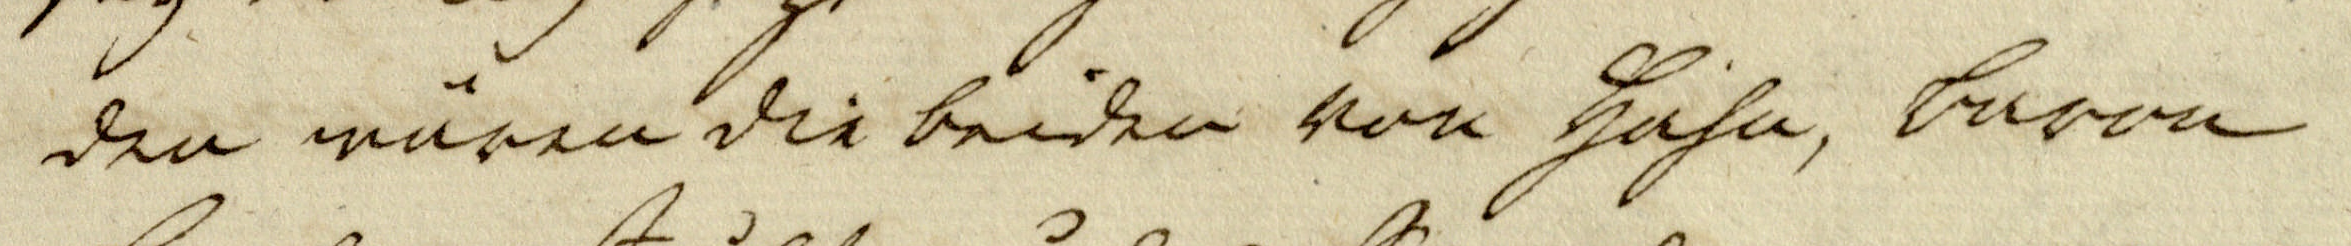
den wären die beiden von Hahn, Baron
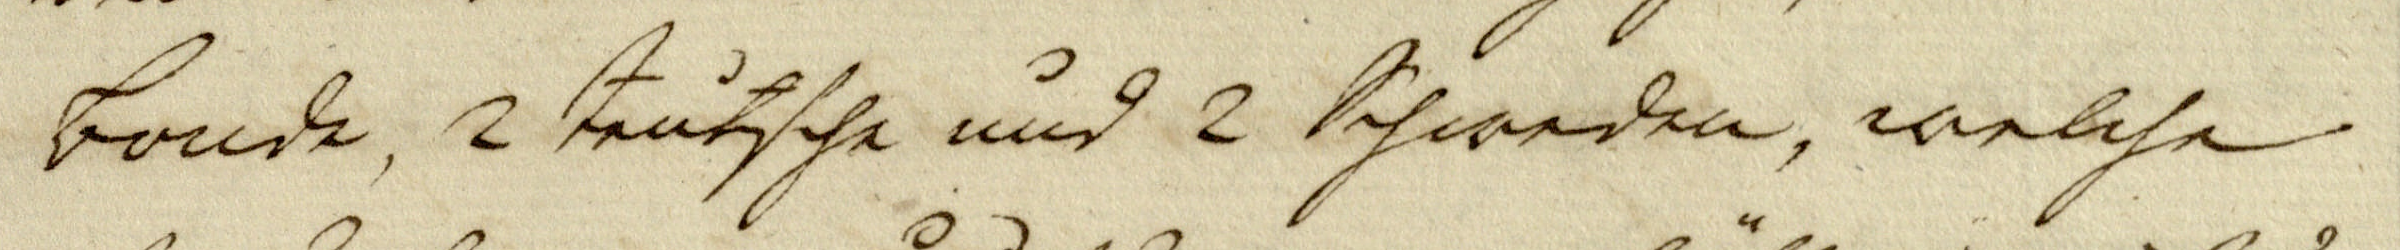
Bonde, 2 Teutsche und 2 Schweden, welche
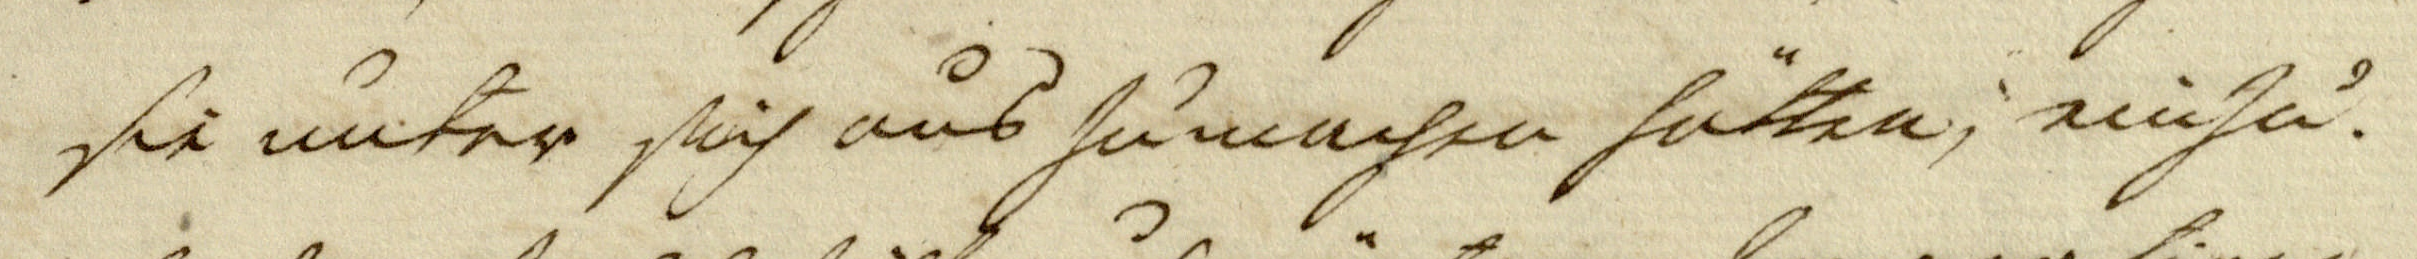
sie unter sich aus zumachen hätten; einzu¬
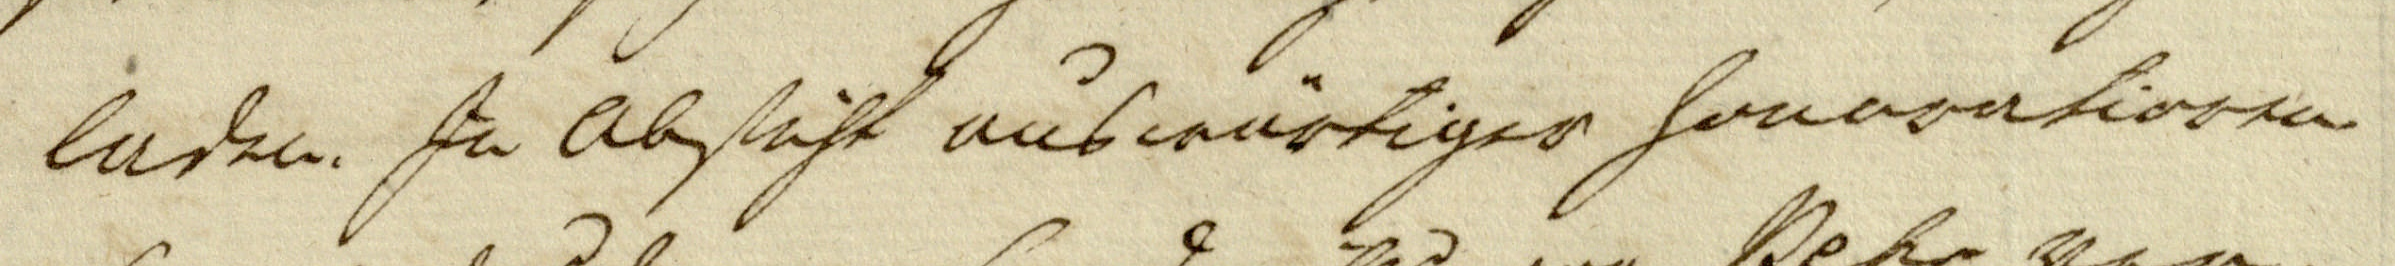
laden. In Absicht auswärtiger Honoratioren
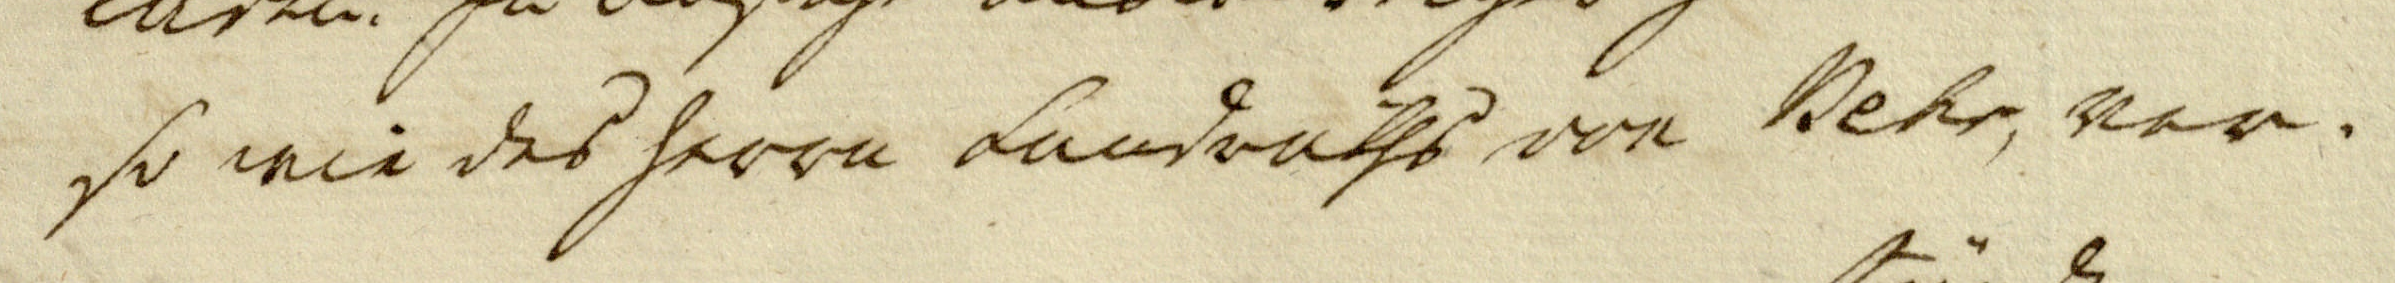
so wie des Herrn Landraths von Behr, ver¬
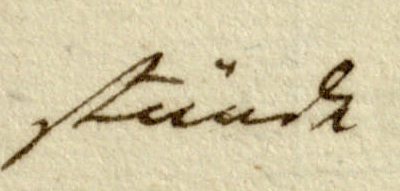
stünde
